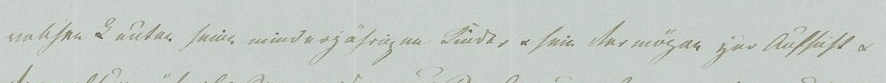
welchen Leuten seine minderjährigen Kinder & sein Vermögen zur Aufsicht &
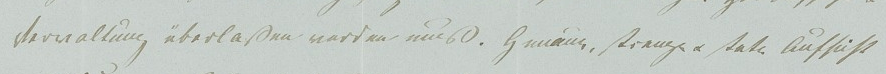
Verwaltung überlaßen werden muß. Genaue, strenge & stete Aufsicht
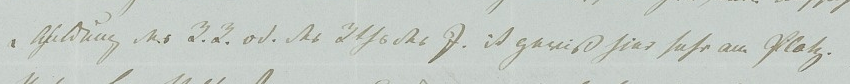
& Ahndung des R.R. od. des Rths des I. ist gewiß hier sehr am Platz.
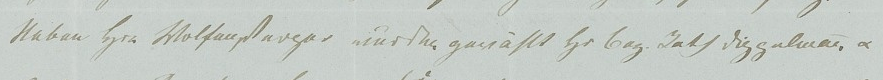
Neben Hrn Wolfensperger wurden gewählt Hr Bez.Rath Diggelmann &
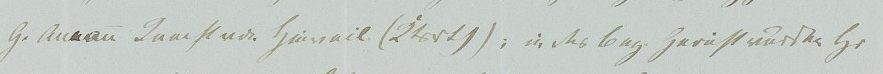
G.Ammann Knecht von Hinweil ( Ktsrth); in das Bez.Gericht wurden Hr
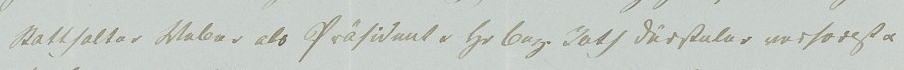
Statthalter Weber als Präsident & Hr Bez.Rath Dürsteler versorgt &
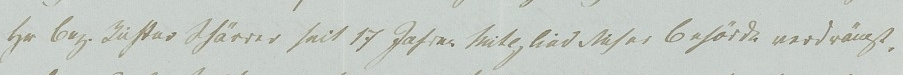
Hr Bez.Richter Schärrer seit 17 Jahren Mitglied dieser Behörde verdrängt,
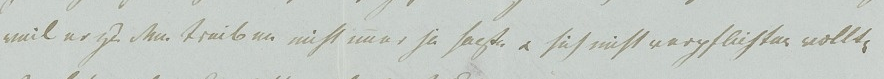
weil er zu dem Treiben nicht immer ja sagte & sich nicht verpflichten wollte
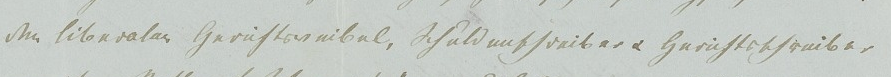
die liberalen Gerichtsweibel, Schuldenschreiber & Gerichtsschreiber
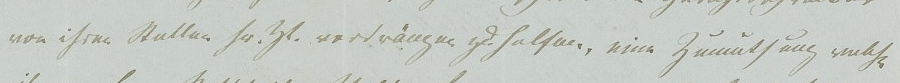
von ihren Stellen sr. Zt. verdrängen zu helfen, eine Zumuthung welche
